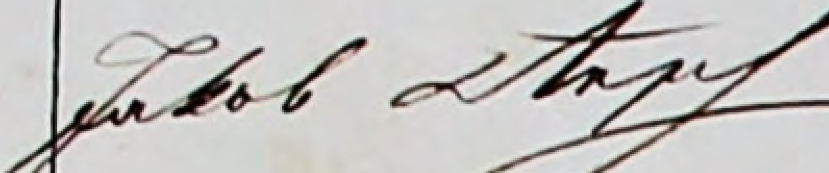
Jakob Aesch
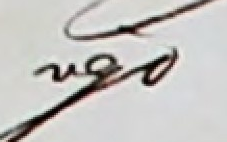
ugo
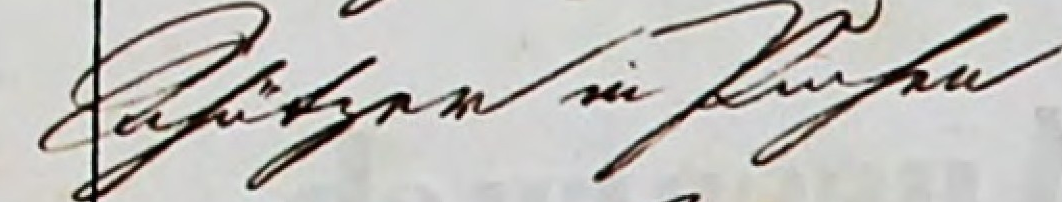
Schätzer in Puchen
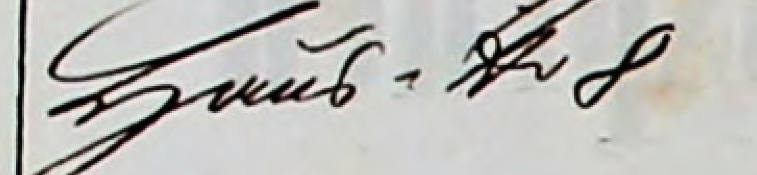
Haus - No 8
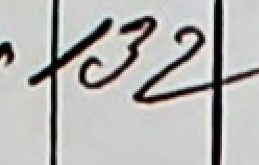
132
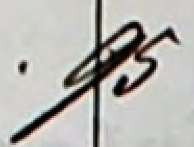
95
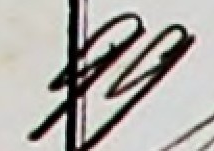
99
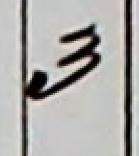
3
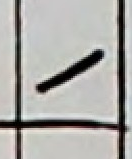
1
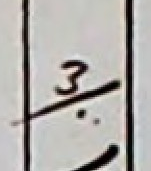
3
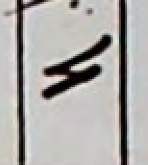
4
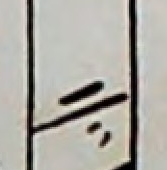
1
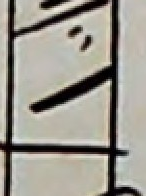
1
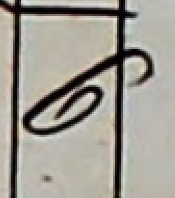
6
